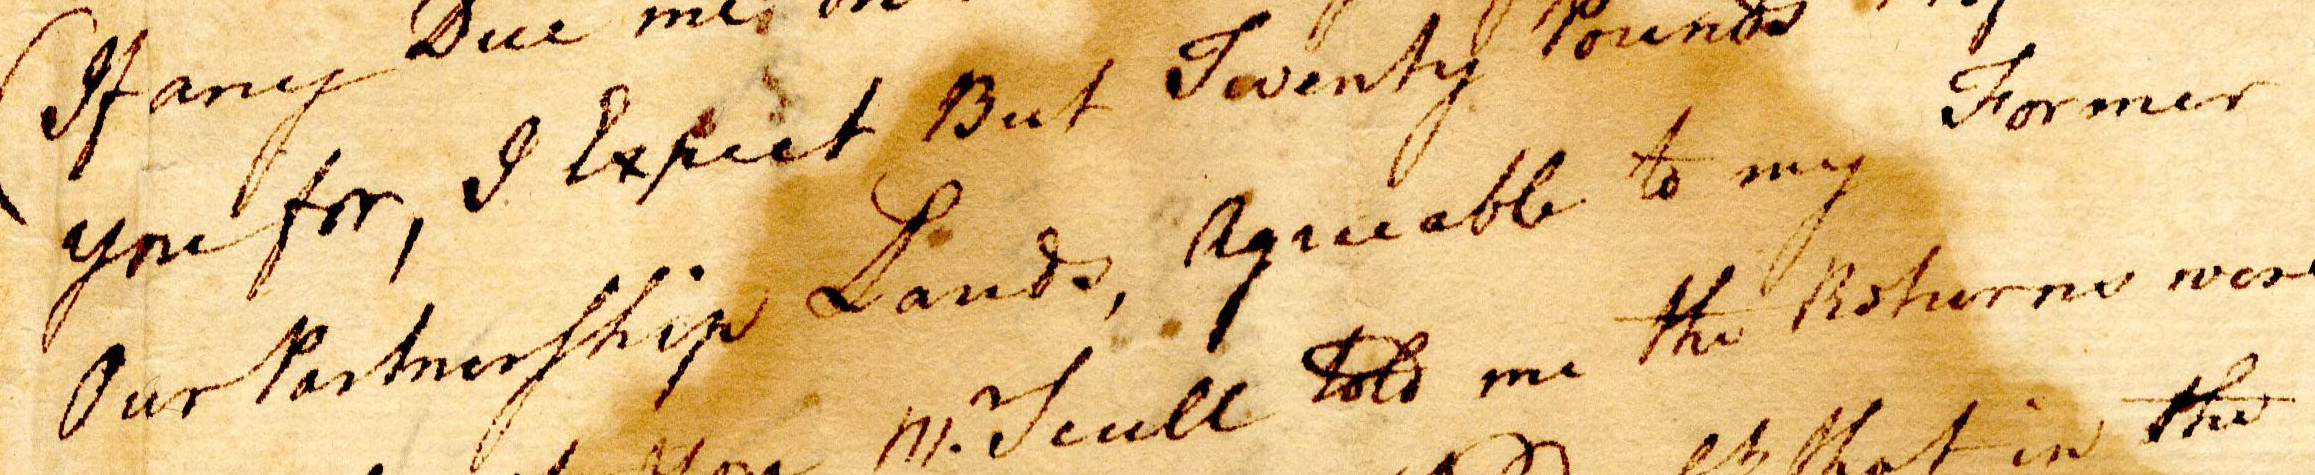Our Partnership Lands, Agreeable to my Former
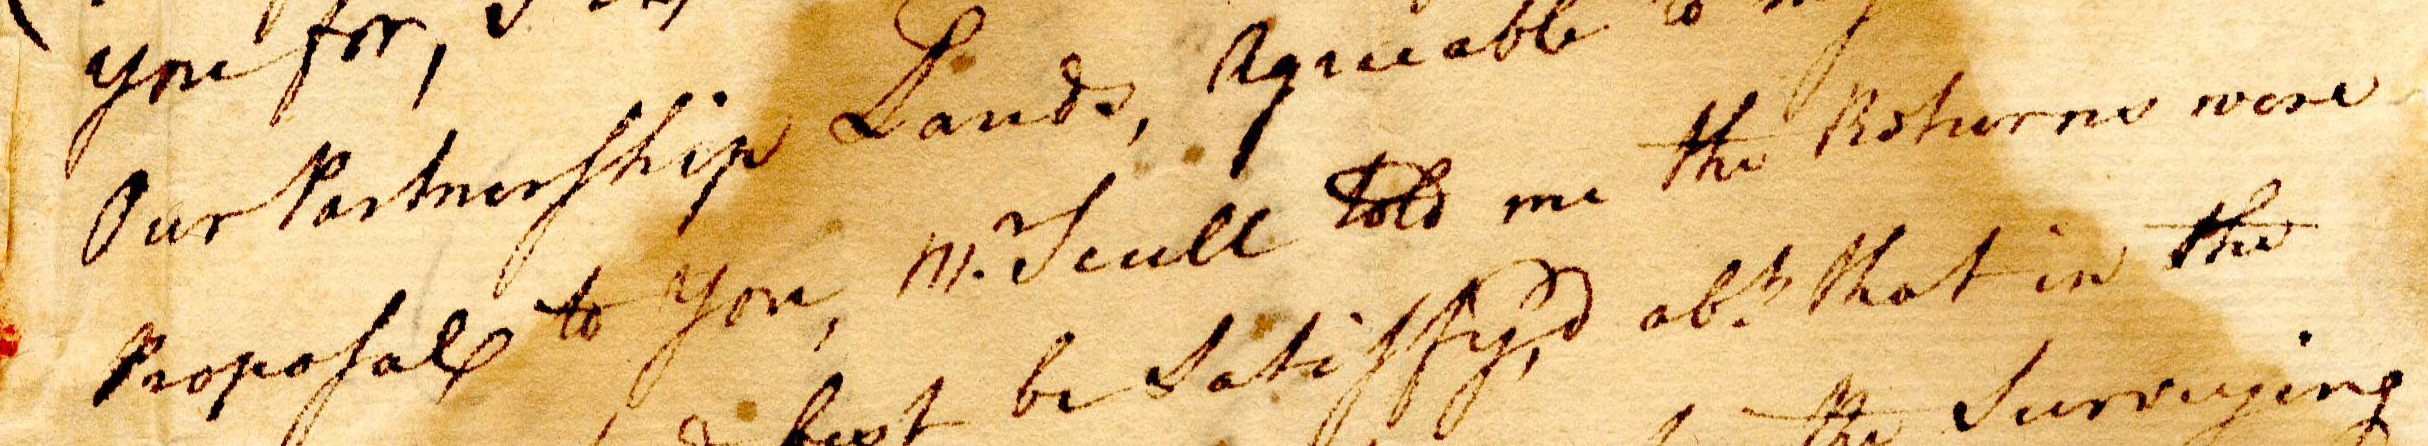Proposal to You, M. Scull told me the Returns were
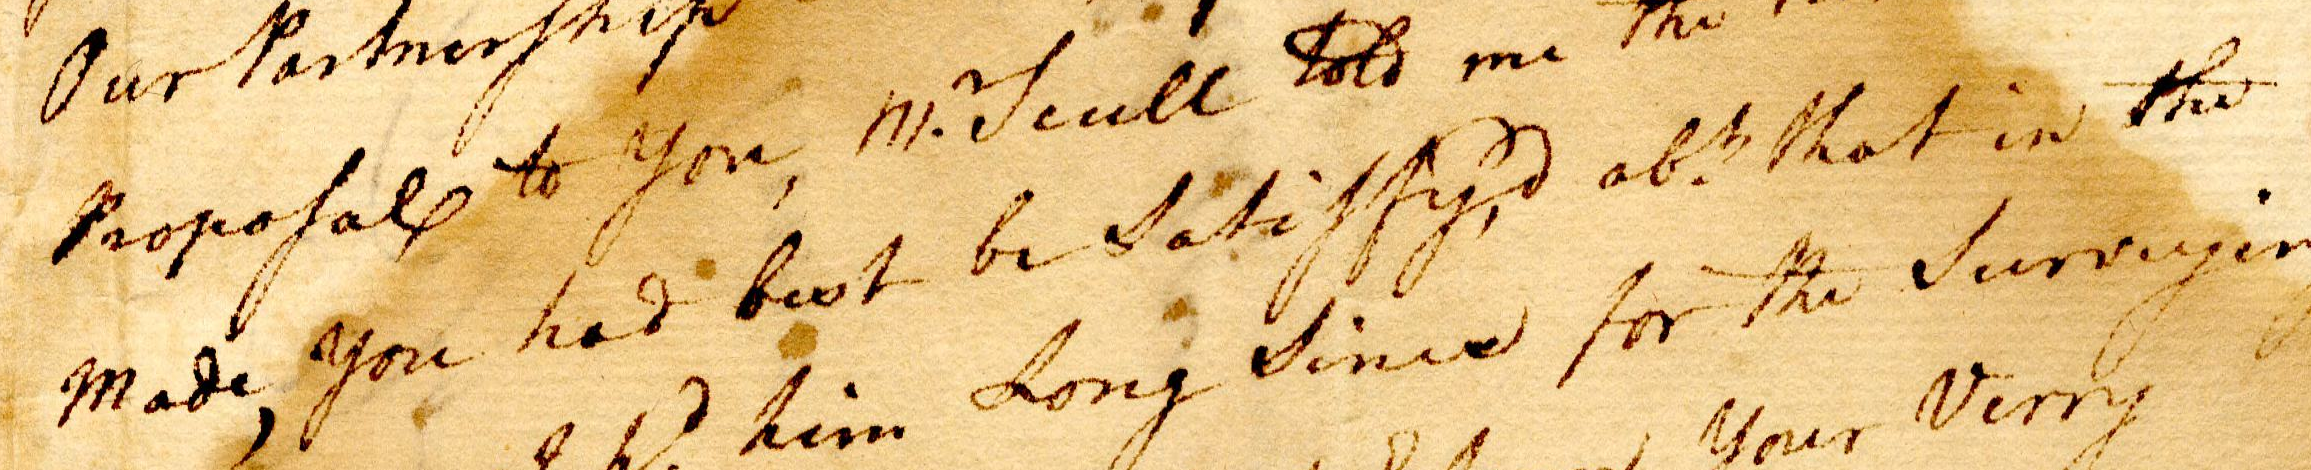made, you had best be Satisfy,d ab^t. that in the
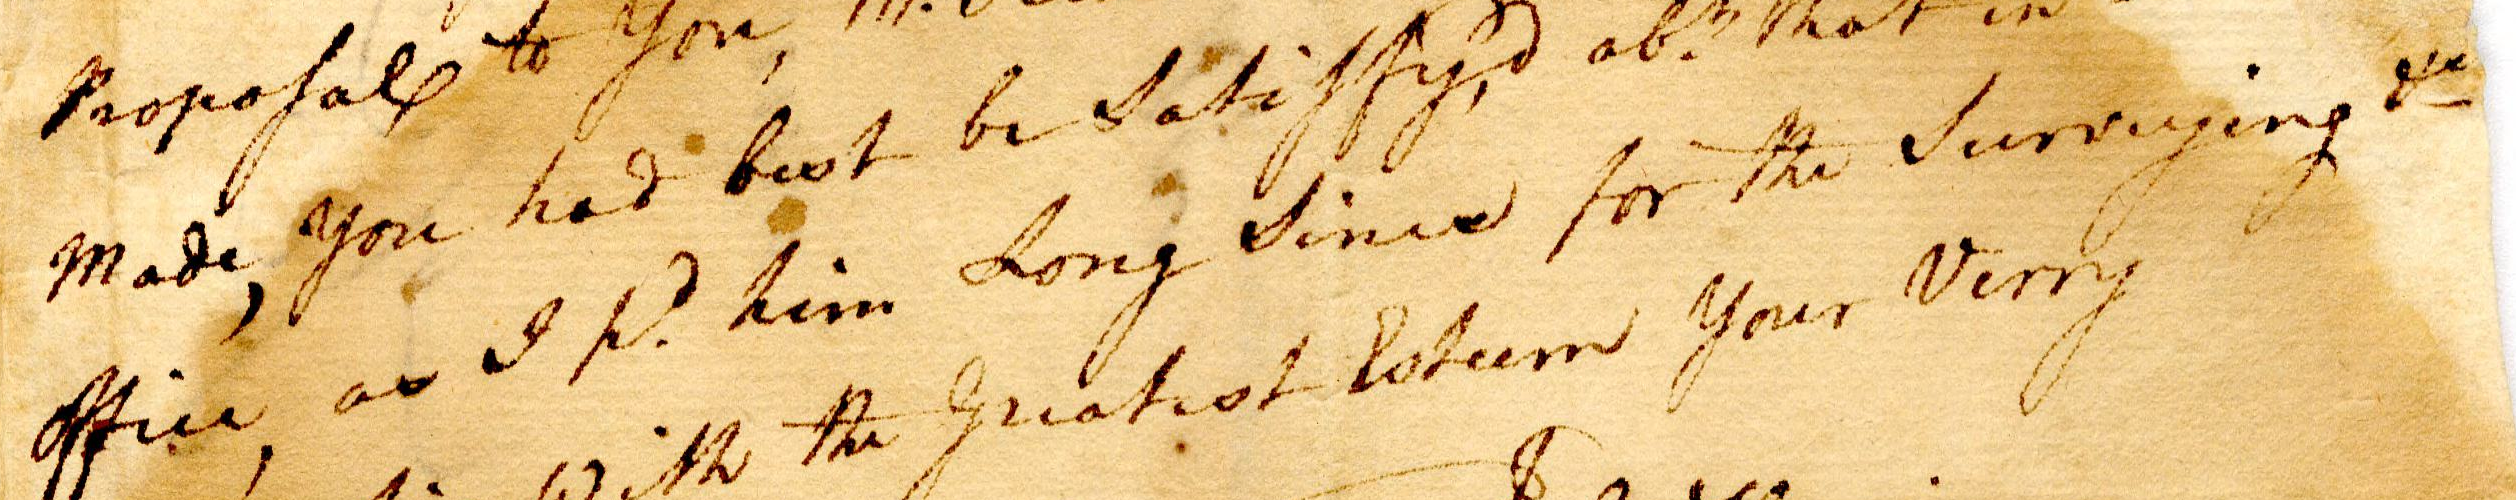office, as I p^d. him Long Since for the Surveying &^c.
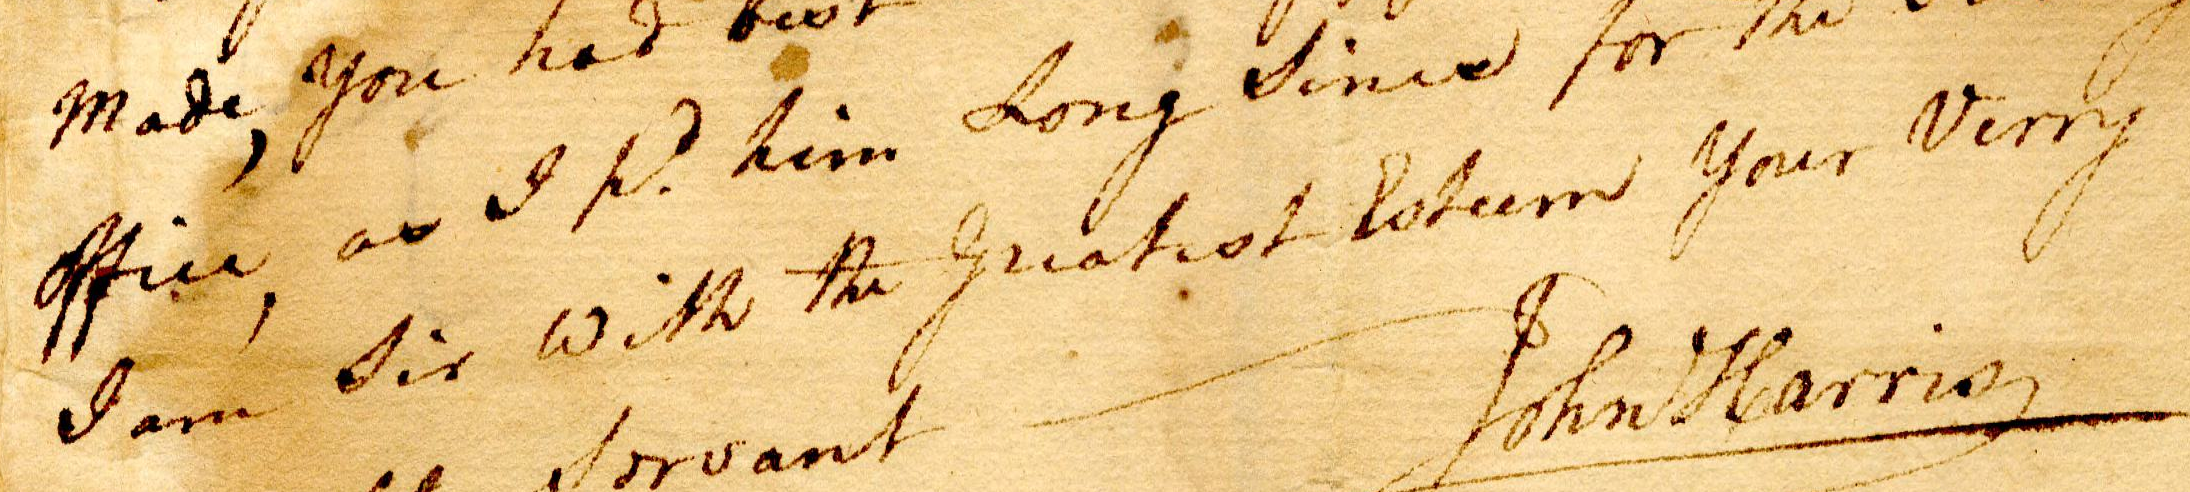I am sir with the greatest Esteem your Verry
